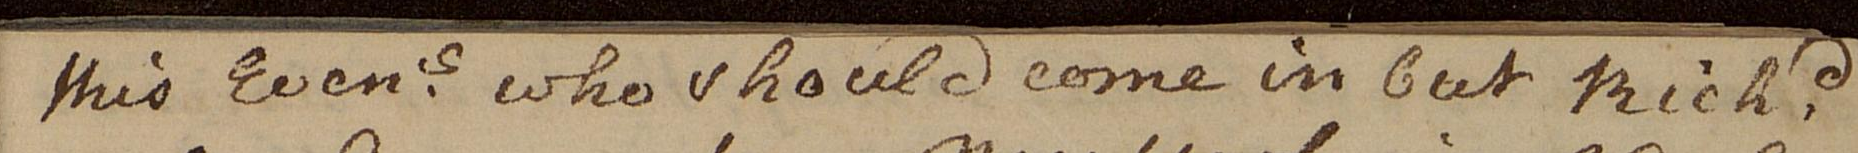this Even^d: who should come in but mich-
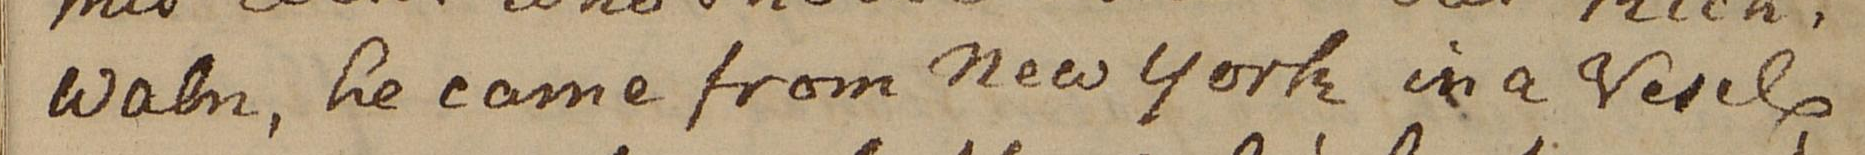Waln, he came from New York in a Vesel
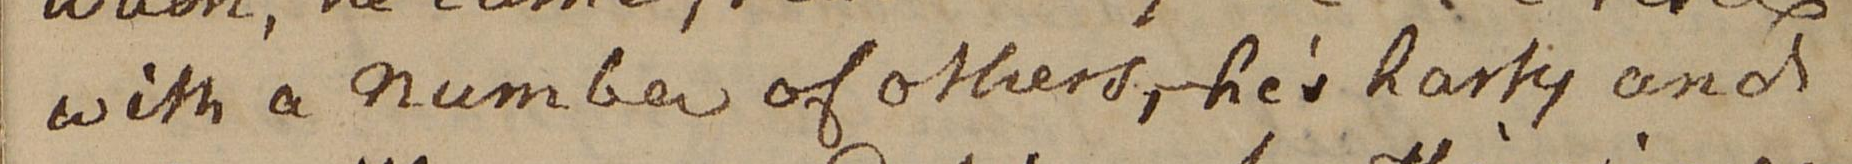with a Number of others, he's harty and
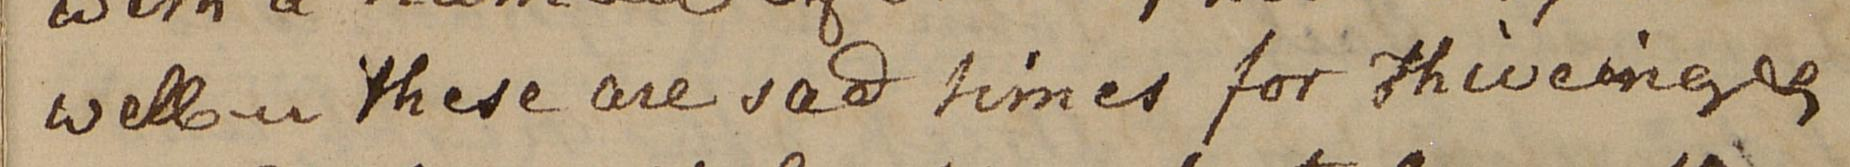well- these are sad times for thiveing &
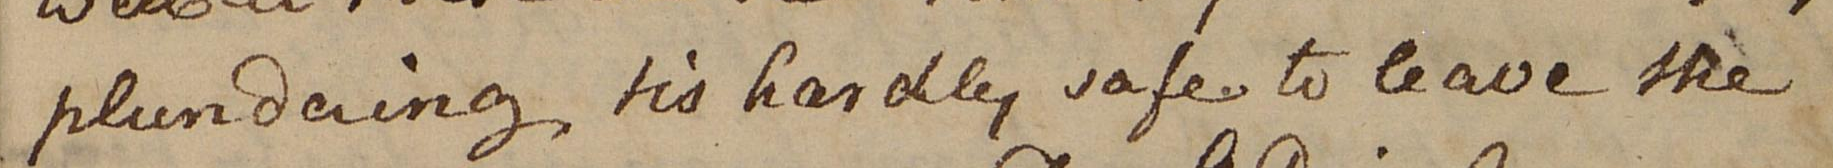plundering tis hardly safe to leave the
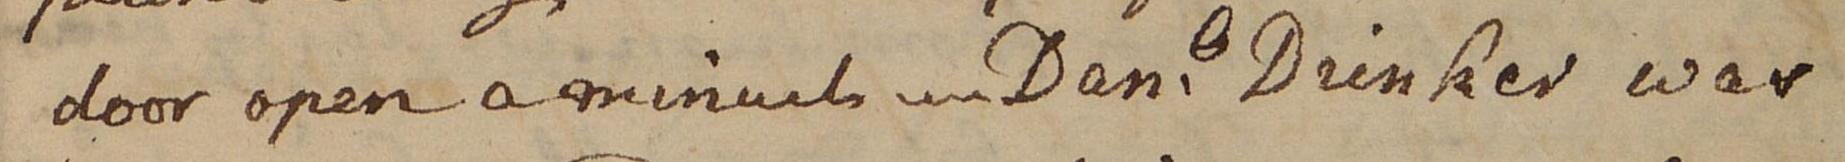door open a minuet- Dan^l Drinker was
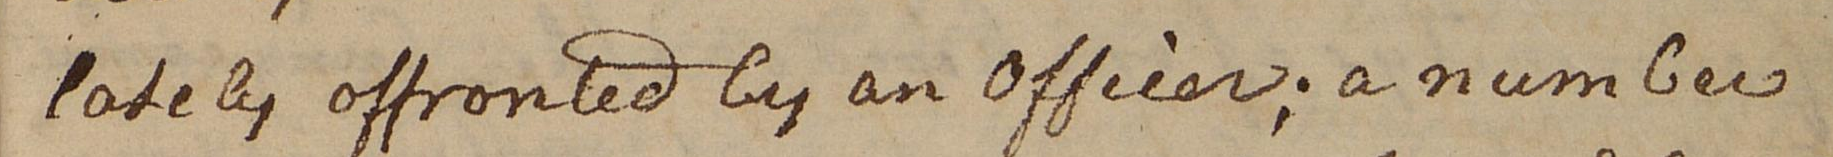lately affronted by an Officer; a number
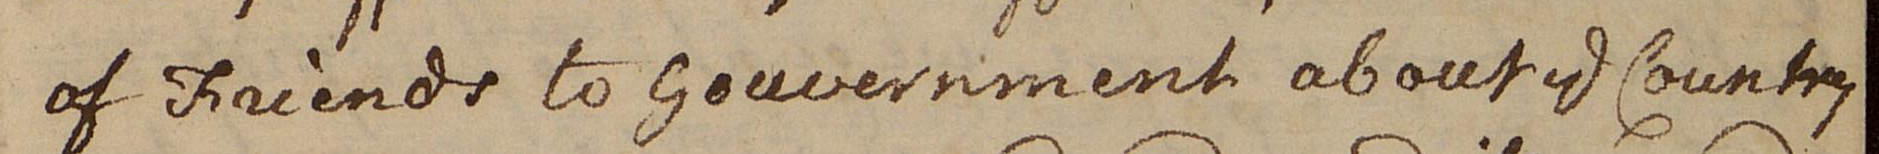of Friends to Gouvernment about y^e Country
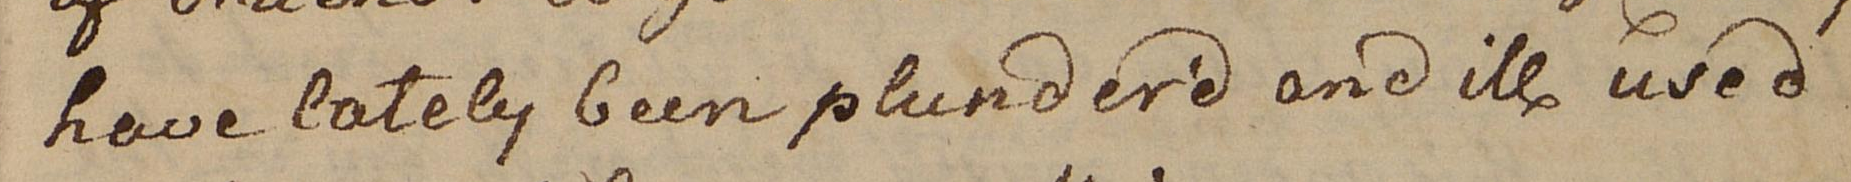have lately been plunder'd and ill used
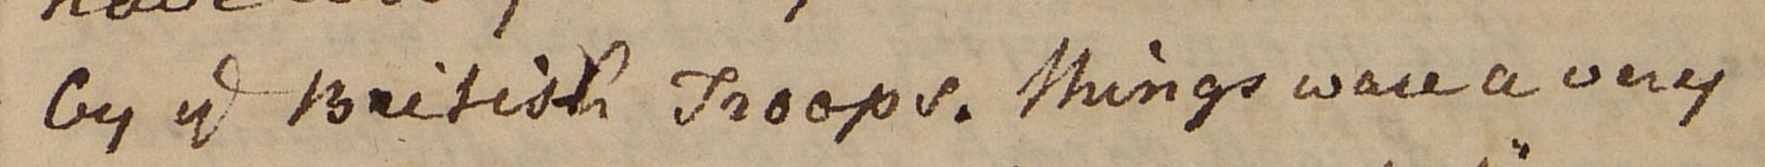by y^e British Troops. Things ware a very
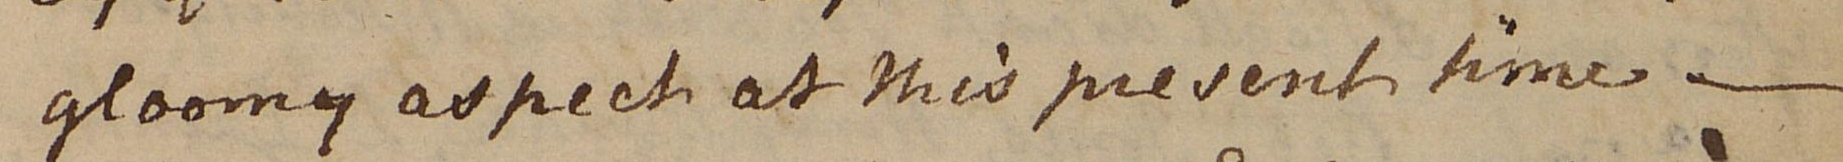gloomy aspect at this present time-
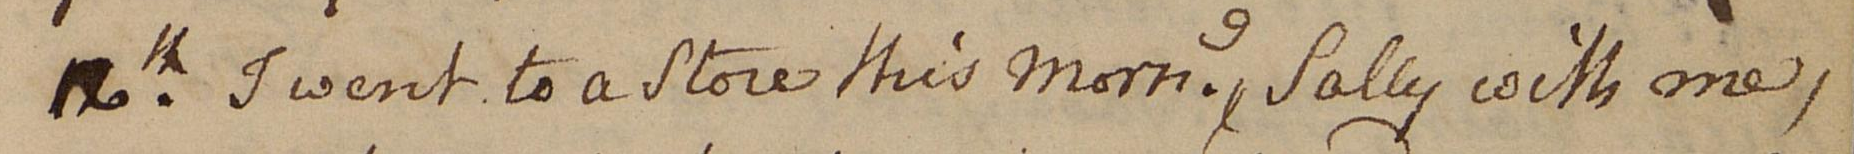1[6]^th. I went to a Store this Morn^g., Sally with me,
